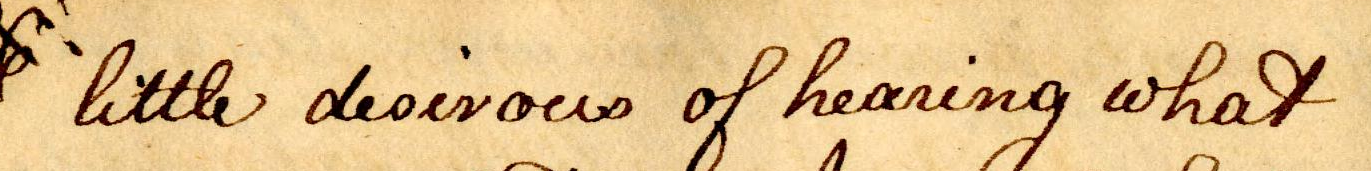little desirous of hearing what
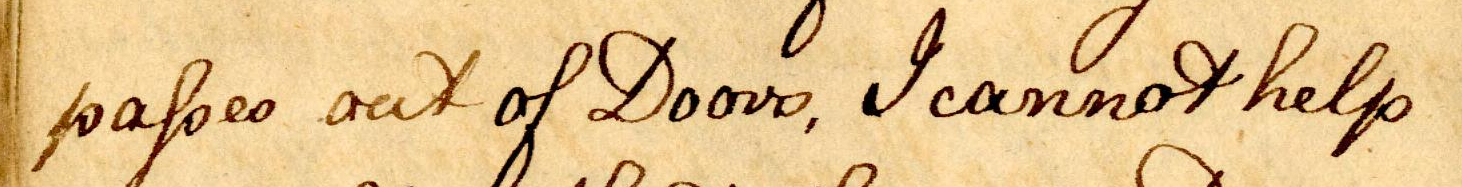passes out of Doors, I cannot help
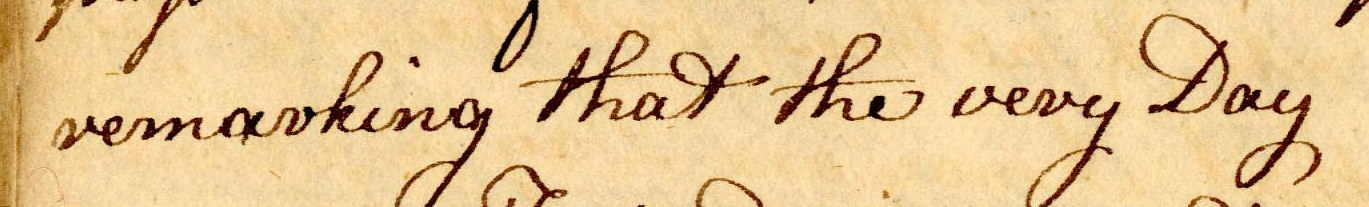remarking that the very Day
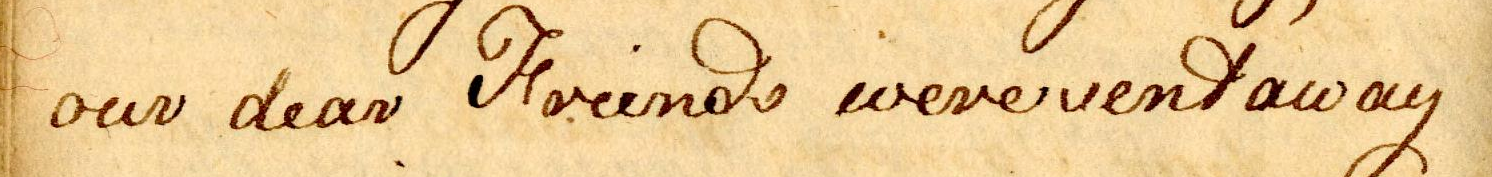our dear Friends were sent away
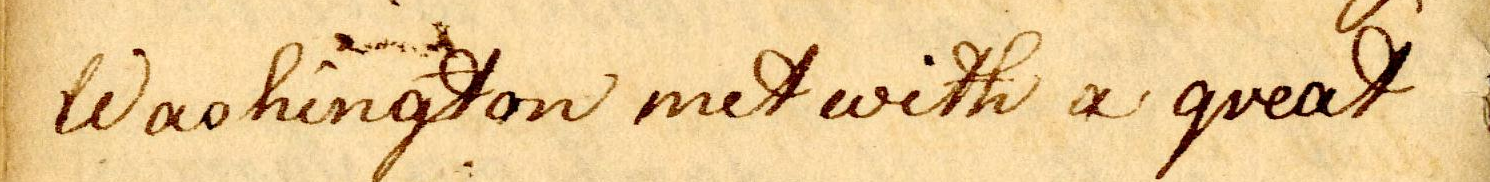Washington met with a great
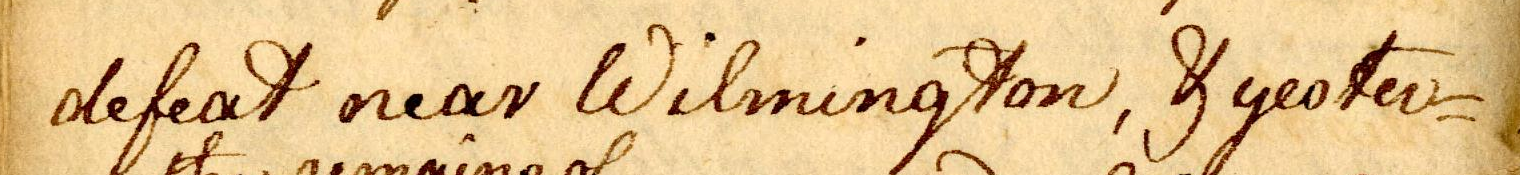defeat near Wilmington, & yester-
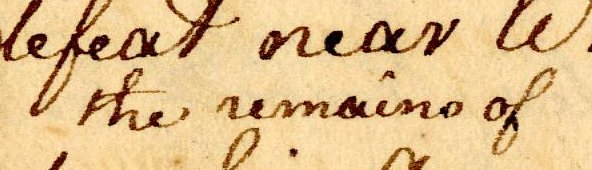the remains of
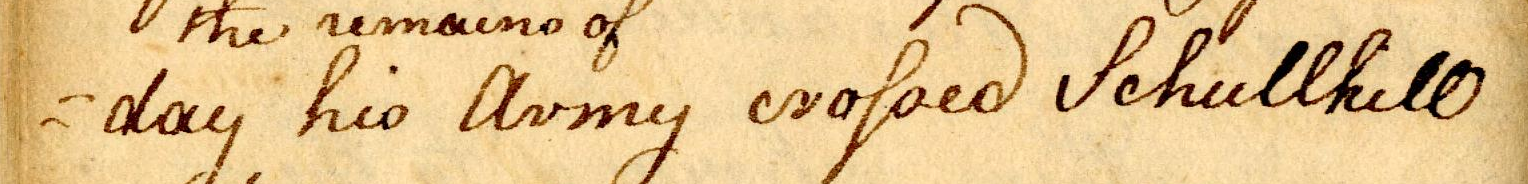-day his Army crossed Schullkill
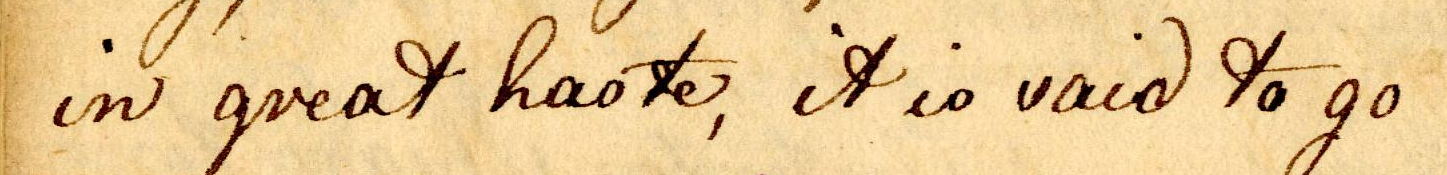in great haste, it is said to go
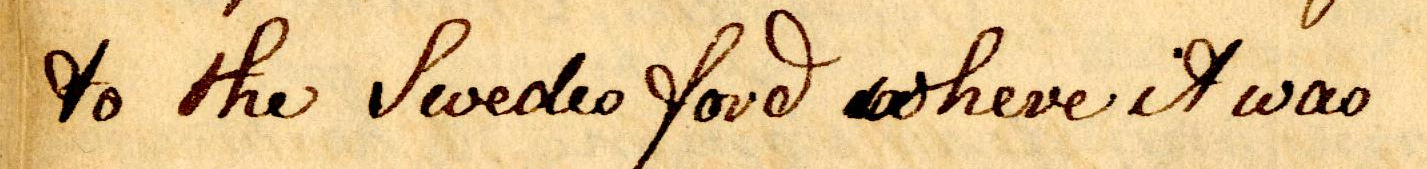to the Swedes ford where it was
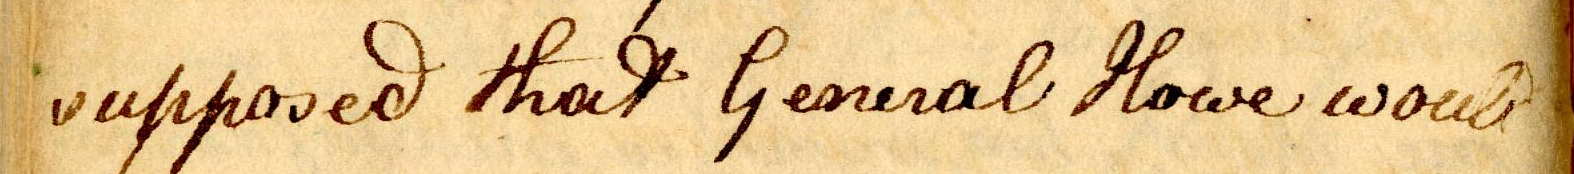supposed that General Howe would
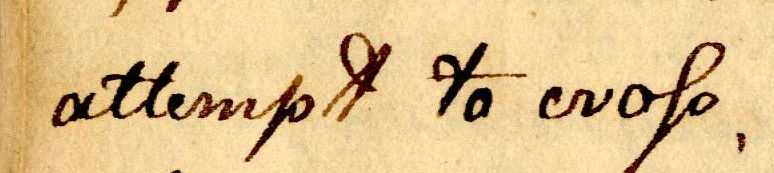attempt to cross,
